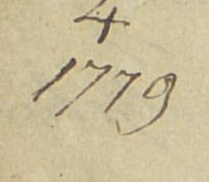1779
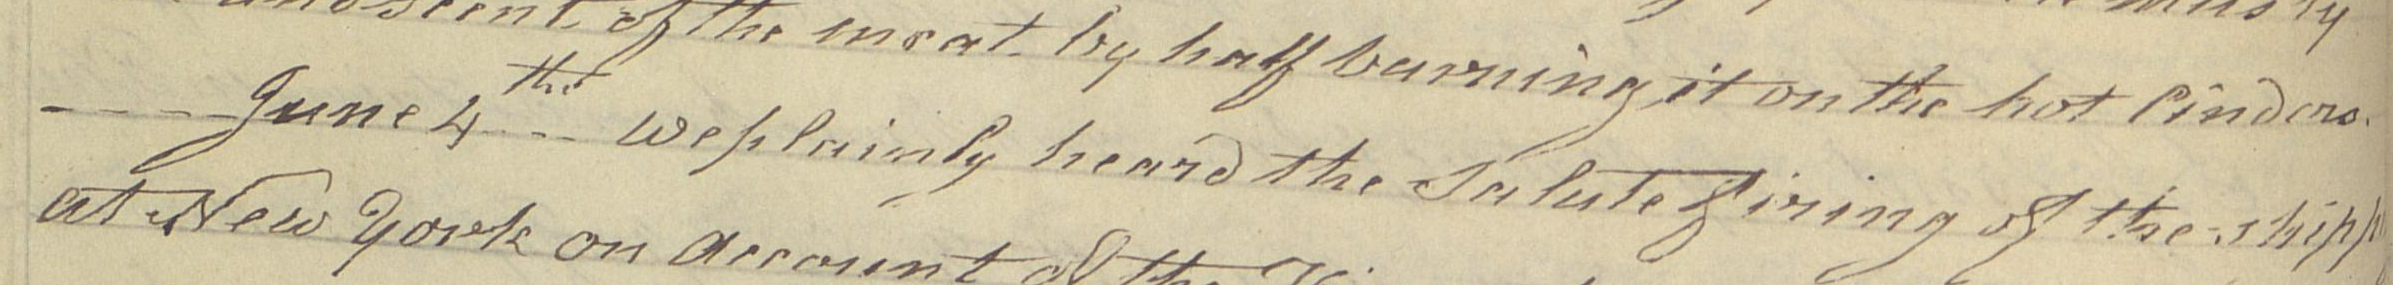June 4^th We plainly heard the Salute firing of tho shipp-
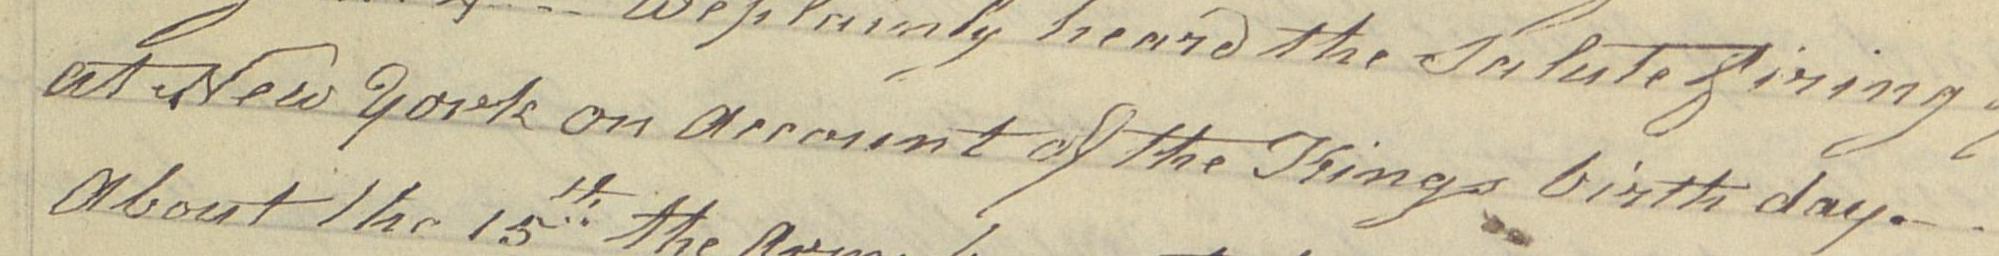at New York on Account of the Kings birth day.
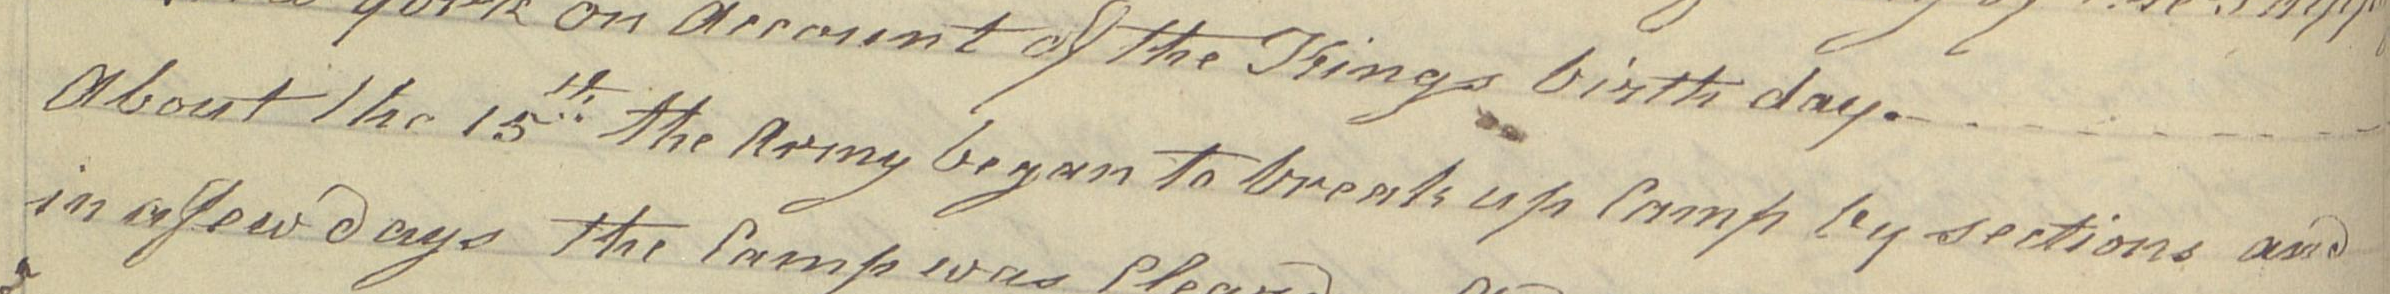About the 15^th the Army began to break up camp by sections and
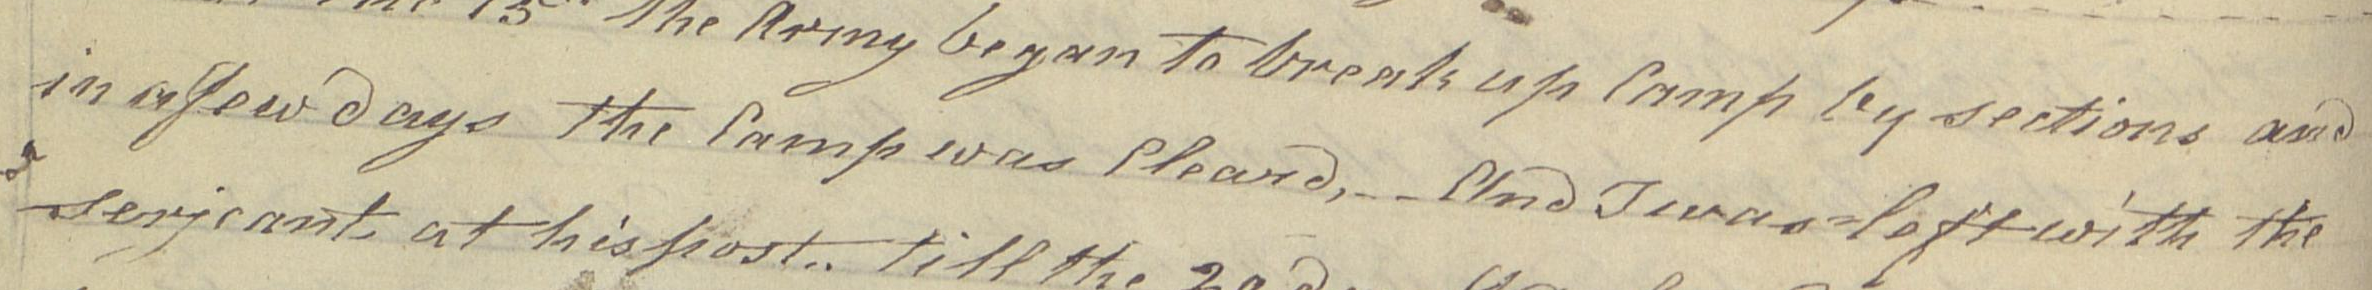in a few days the Camp was Cleard, And I was left with the
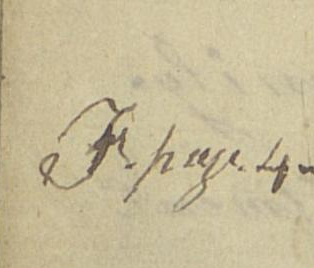F page 4
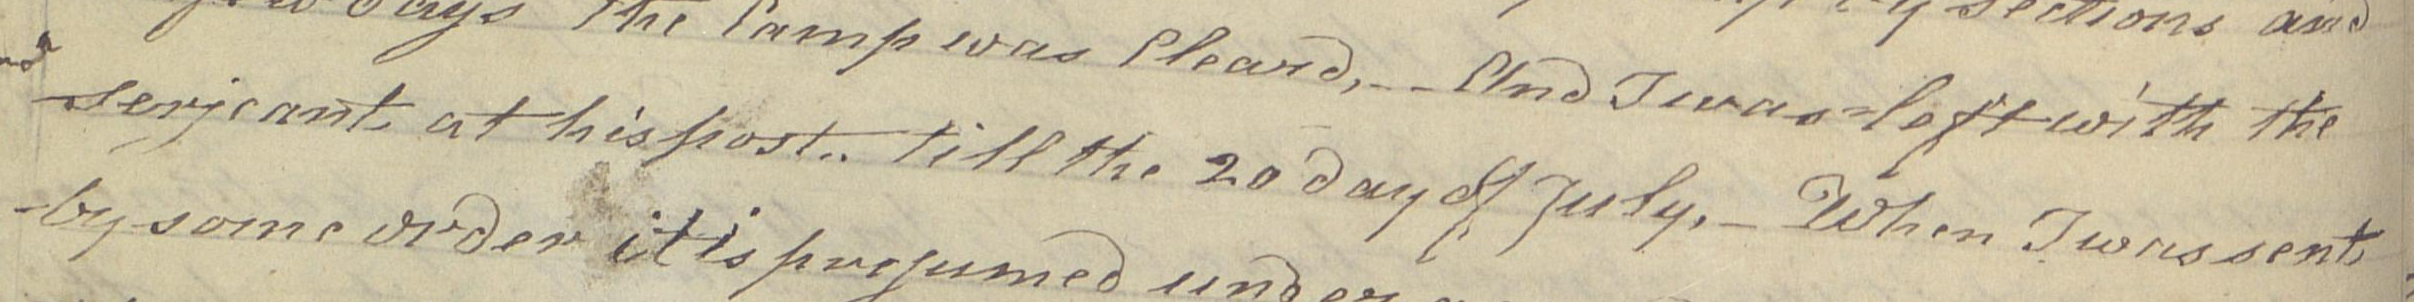serjeant at his post. tell the 20 day of July. When I was sent
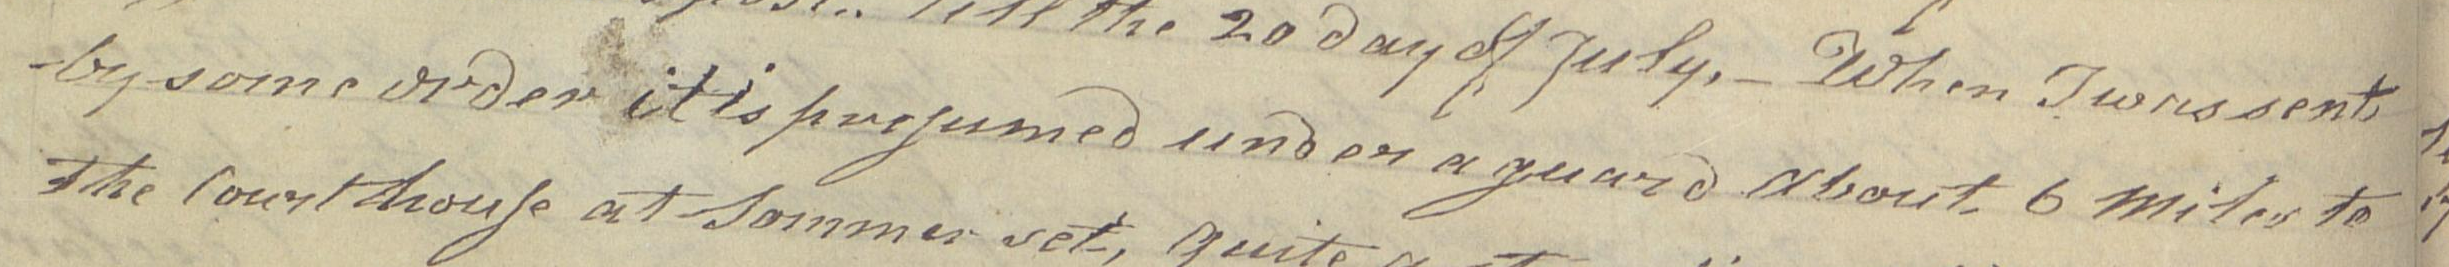by some order it is presumed under a guard about 6 Miles to
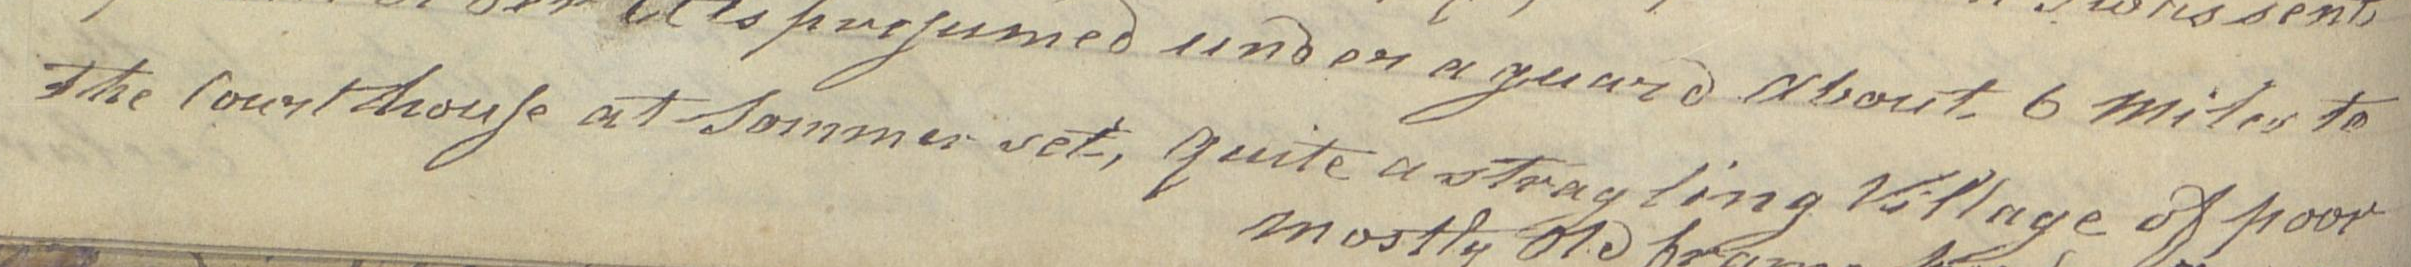The Court house at Sommerset, quite a strugling Village of poor
